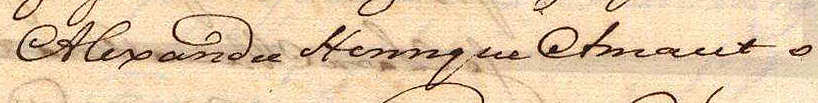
Alexandre Henrique Arnaut o
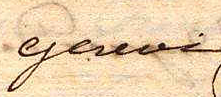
escrevi
